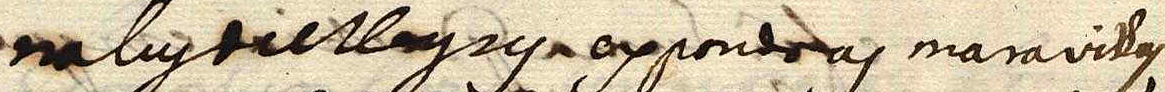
na ley de Moyzes expondoas maravilhas,
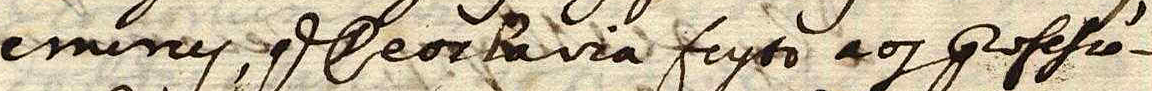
e merces, q̄ Deos havia feyto aos professo
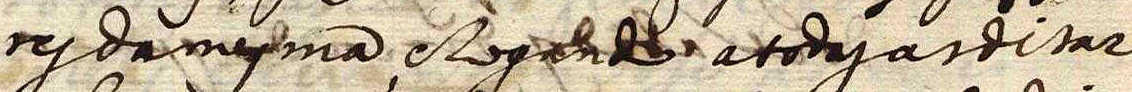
res da mesma, e Rogando a todas as ditas
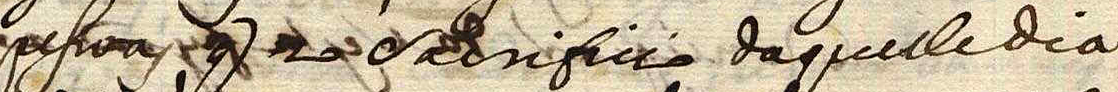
pessoas, q̄ no sacrificio daquelle dia
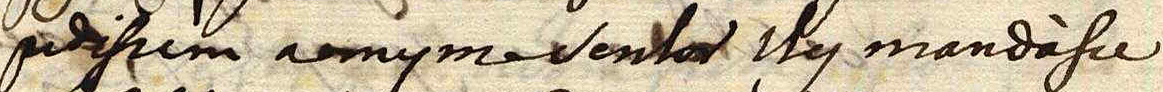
pedissem ao mesmo senhor lhes mandàsse
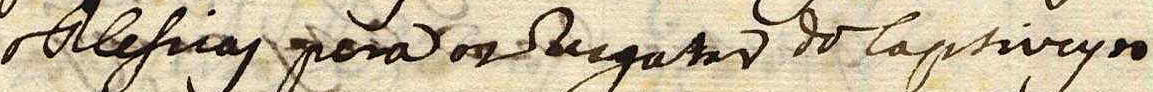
o Messias pera os Resgatar do Captiveyro
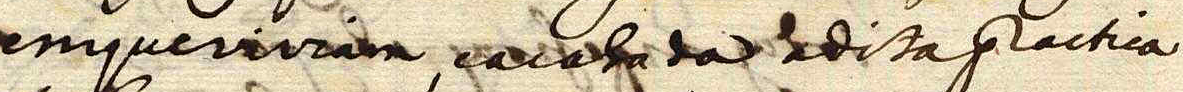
em que viviam, e acabada a dita practica
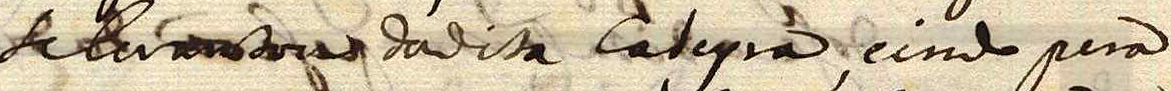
se levantou da dita Cadeyra, e indo pera
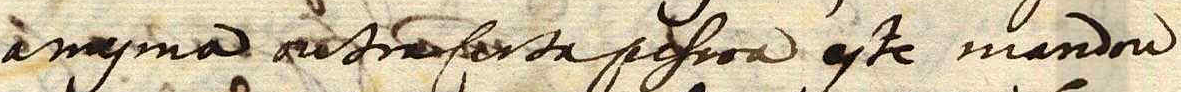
a mesma outra Certa pessoa este mandou
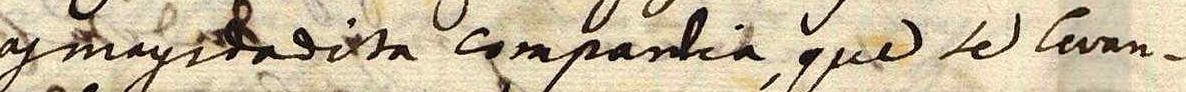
as mays da dita companhia, que se levan
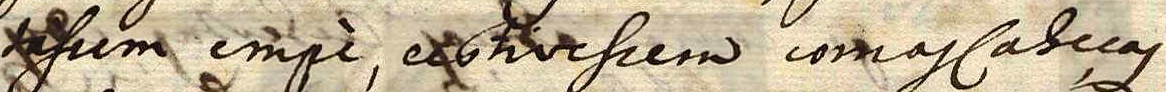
tassem em pè, e estivessem com as Cabeças
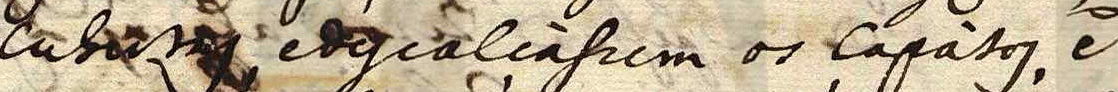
cubertas, e descalçassem os Çapátos, e
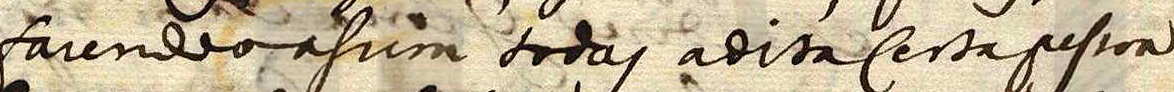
fazendoo assim todas a dita Certa pessoa
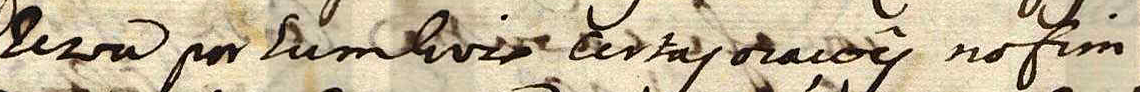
Rezou por hum liuro certas oraçoês no fim
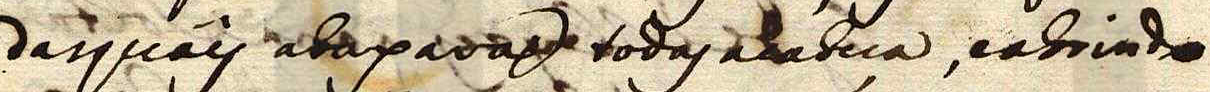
das quâes abaxavaõ todas a cabeça, e abrindo
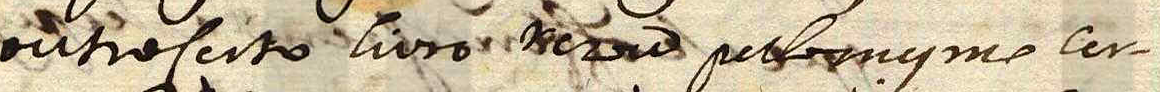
outro Certo livro rezou pello mesmo cer
